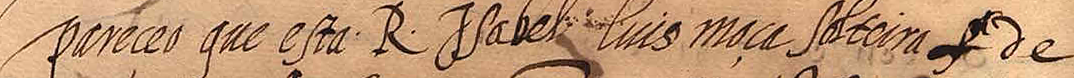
pareceo que esta R. Isabel luis moça solteira fa de
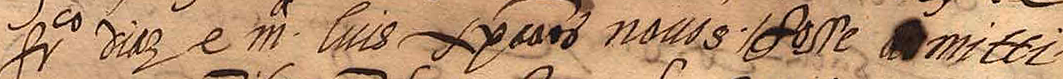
frco diaz e ma. luis xp̄aos nouos ./. fosse admitti
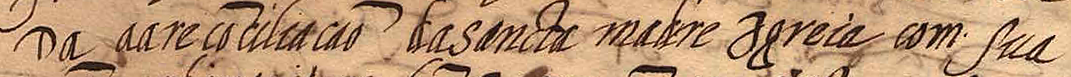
Da aa recōciliaçaõ da sancta madre Igreia com sua
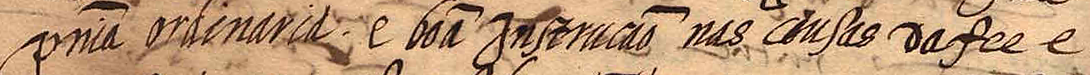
pn̄ia ordinaria e bōa Jnstrução nas cousas da fee e
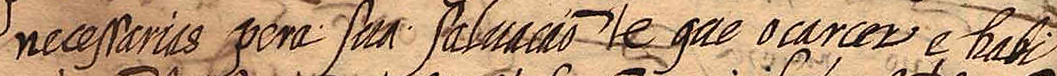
necessarias pera sua saluaçaõ te que o carcer e habi
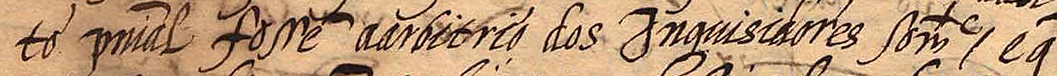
to pn̄ial fossē a arbitrio dos Jnquisidores somte / e q̄
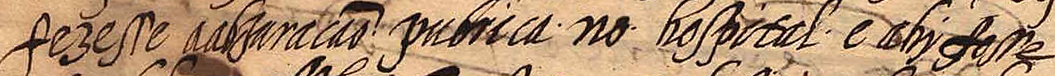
fezesse a abjuração pubrica no hospitaL e ahy fosse
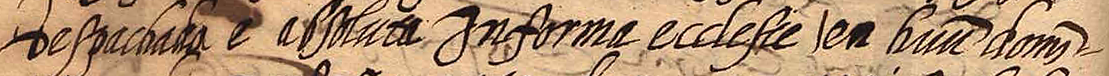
despachada e absoluta Jn forma ecclesie / en hūu domī
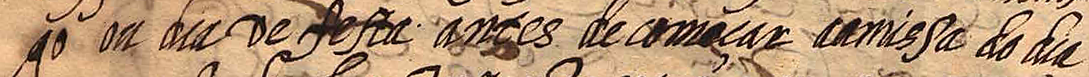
go ou dia de festa antes de começar aa missa do dia
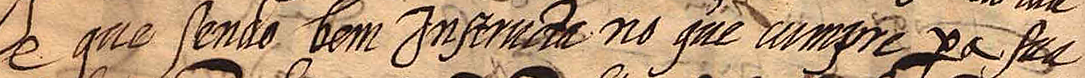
e que sendo bem Jnstructa no que cumpre ꝑa sua
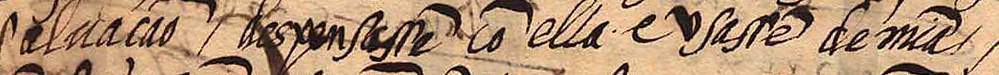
saluação / despensassē cō ella e vsassē de mīa /
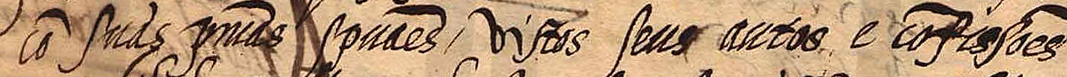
cō suas pn̄ias spūaes / vistos seus autos e cōfissões
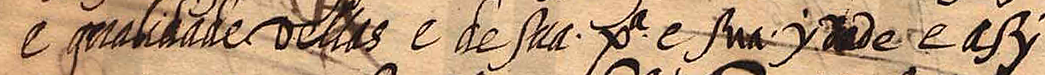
e qualidade Dellas e de sua pa e sua ydade e asy
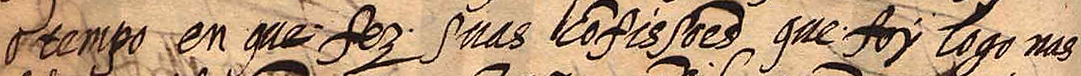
o tempo en que fez suas cōfissões que foy logo nas
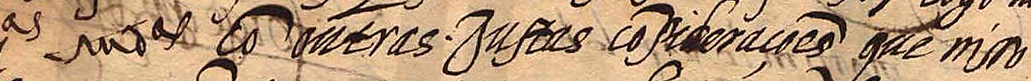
1as audas cō outras Justas cōsiderações que nisso
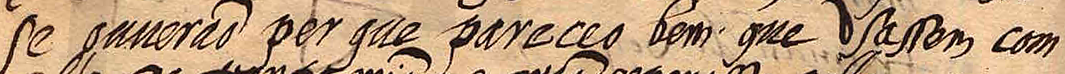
se ouuerão per que pareceo bem que vsassem com
